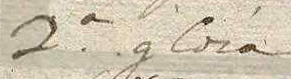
2a gloza
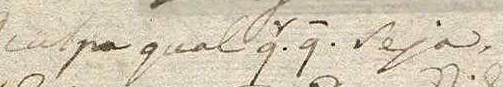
A culpa qualq.r q̄. seja
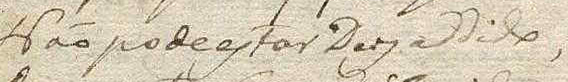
Naõ pode estar Deos addido,
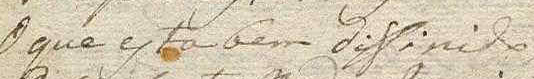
O que esta bem diffinido
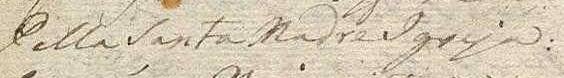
Pella Santa Madre Igreja:
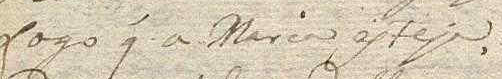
Logo q̄ a Maria esteja,
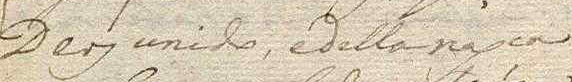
Deos unido, e della nasça
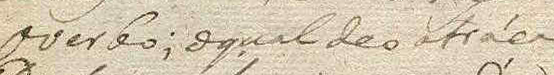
o verbo; o qual deo a tráça
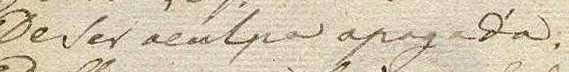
De ser a culpa apagada;
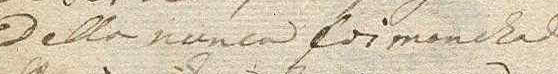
Della nunca foi manchada
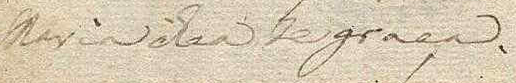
Maria chea de graça.
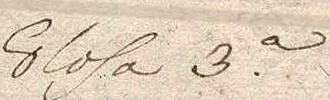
Glosa 3.a
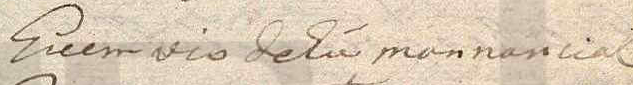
Quem vio de hū mannancial
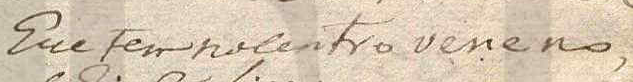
Que tem no centro veneno,
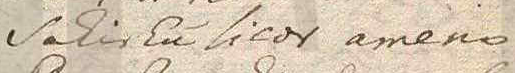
Sahir hū licor ameno
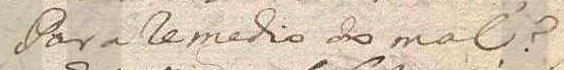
Para Remedio do mal?
